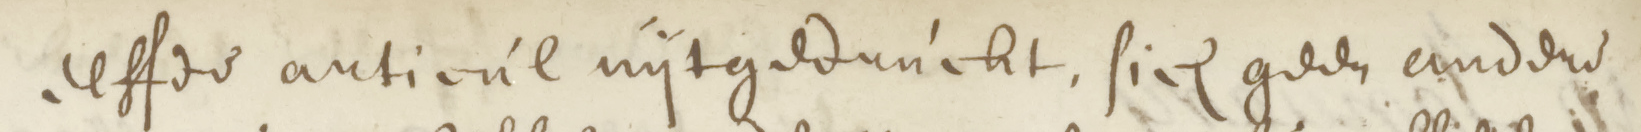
elffde articul uijtgedruckt, sich geen andere
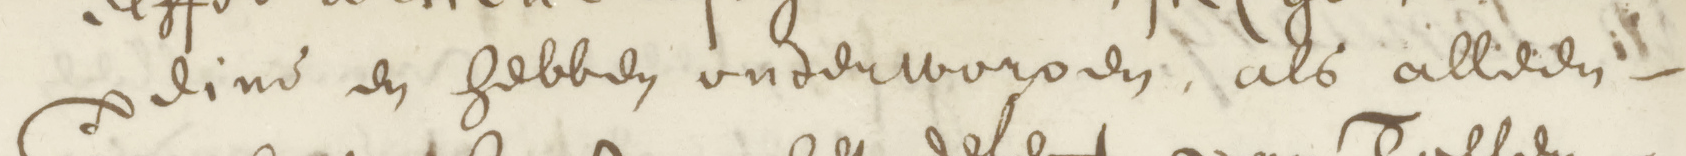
peine en hebben onderworpen, als alleen
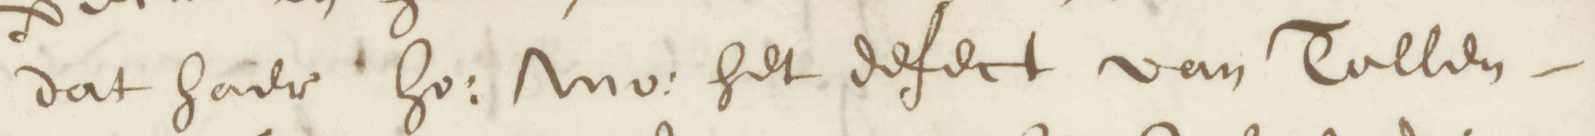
dat haer ho:Mo: het defect van Tollen -
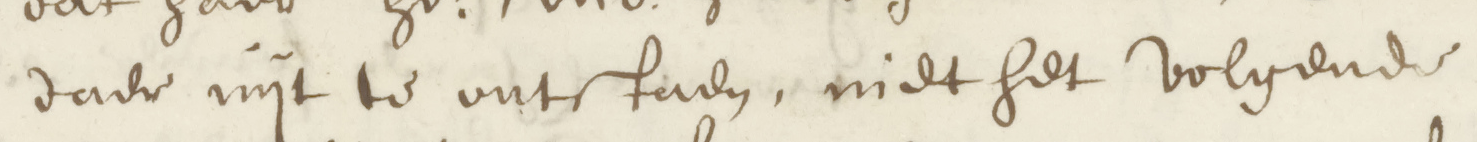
daer uijt te ontstaen, niet het volgende
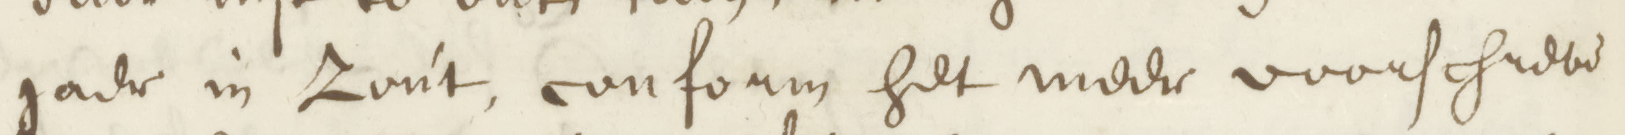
jaer in Zout, conform het meer voorschreve
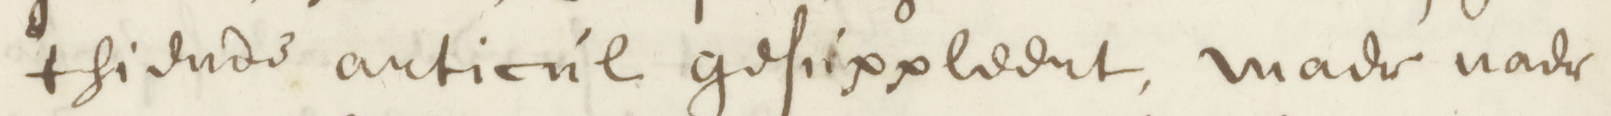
thiende articul gesuppleert, maer naer
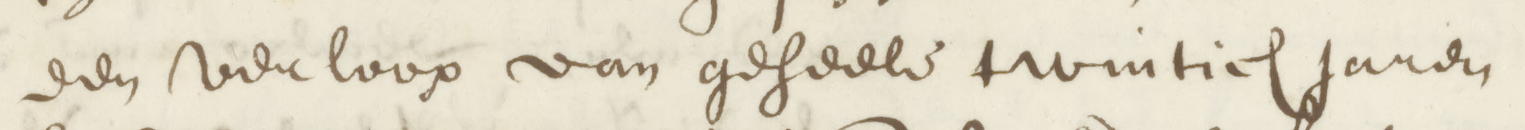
een verloop van geheele twintich jaren
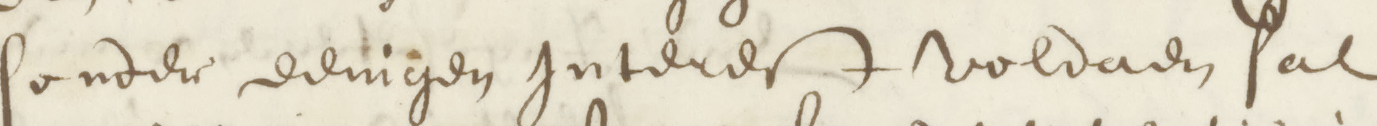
sonder eenigen interest voldaen sal
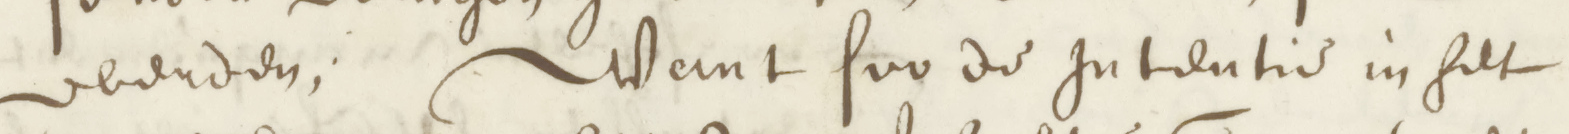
werden; Want soo de intentie in het
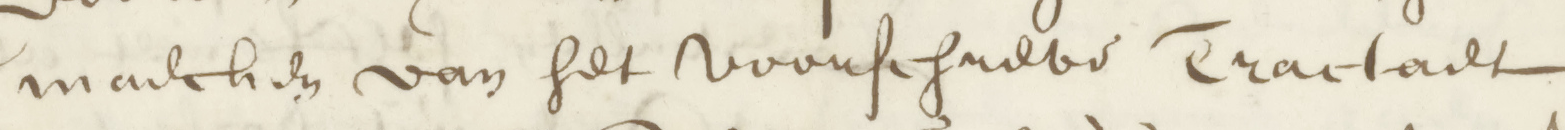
maecken van het voorschreve Tractaet
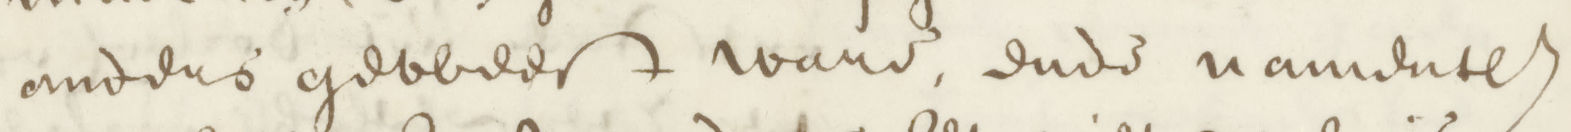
anders geweest ware, ende namentl.
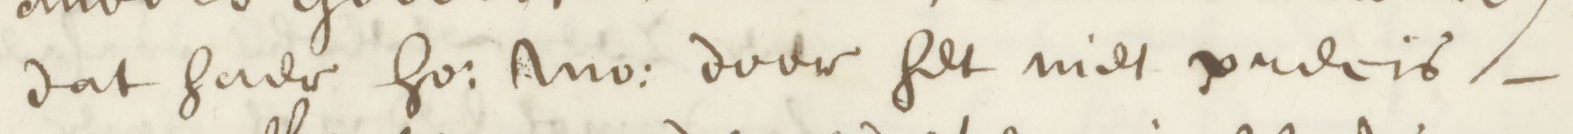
dat haer ho:Mo: door het niet precis
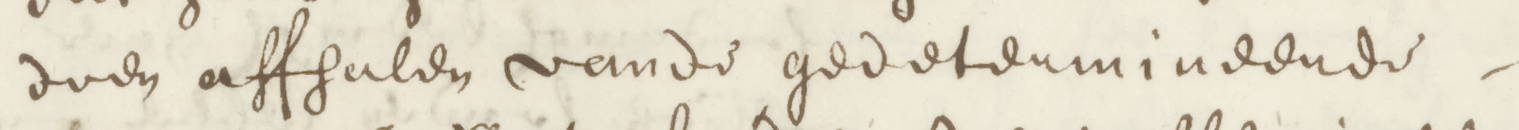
doen affhalen vande gedetermineerde
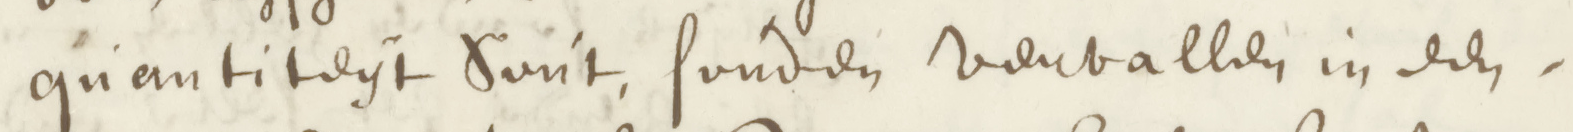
quantiteijt Sout, souden vervallen in een
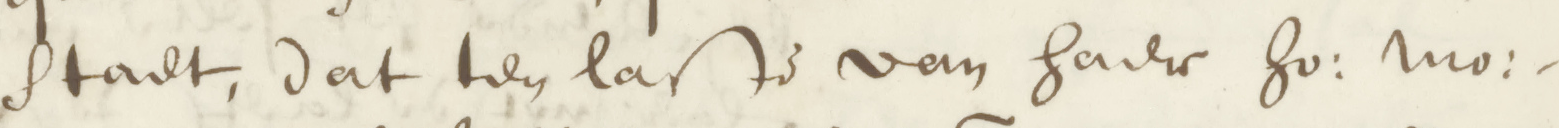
staet, dat ten laste van haer ho:Mo:
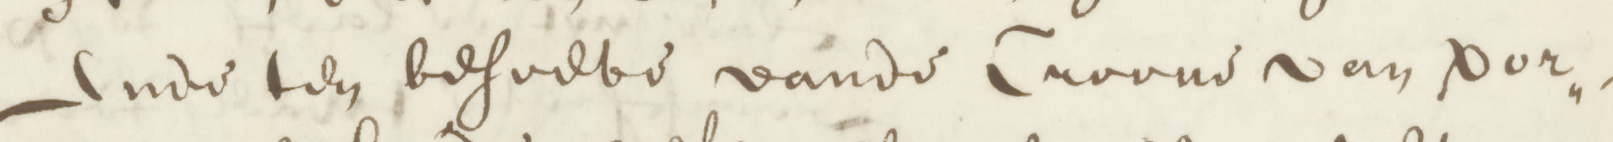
ende ten behoeve vande Croone van por„
